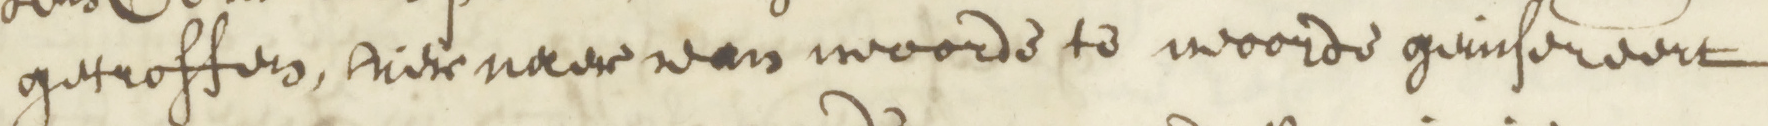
getroffen, hier naer van woorde te worde geinsereert.
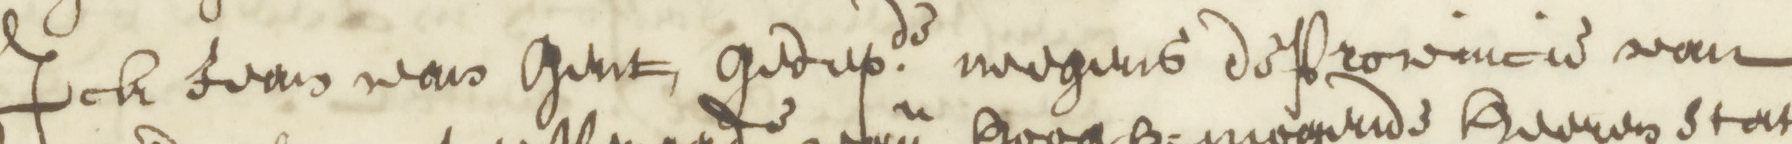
Ick Joan van Gent, Gedep.de wegens de Provincie van
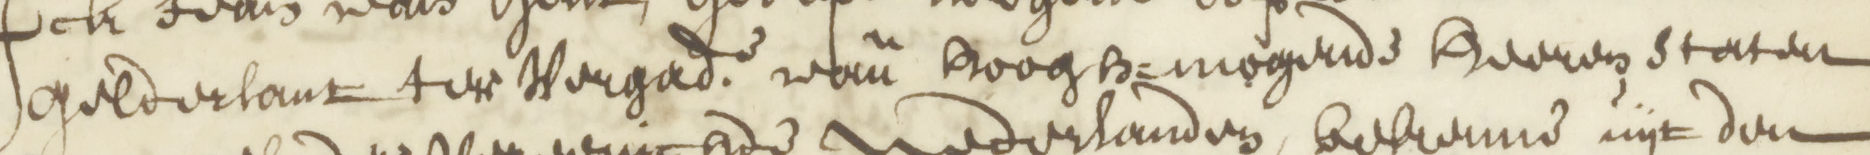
Gelderlant ter Vergad.e van Hoogh=mogende Heeren staten
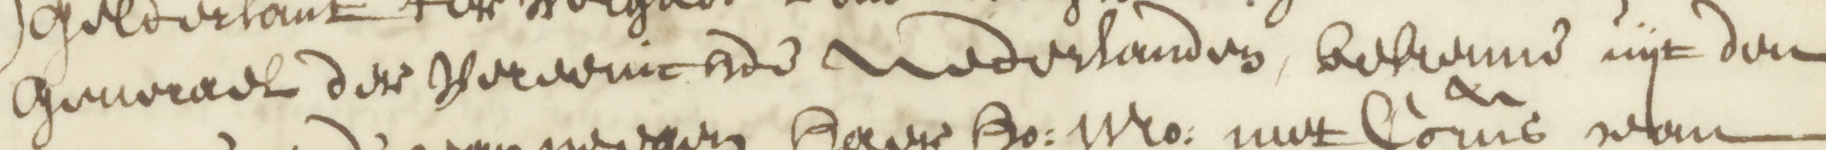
Generael der Vereenichde Nederlanden, bekenne uijt den
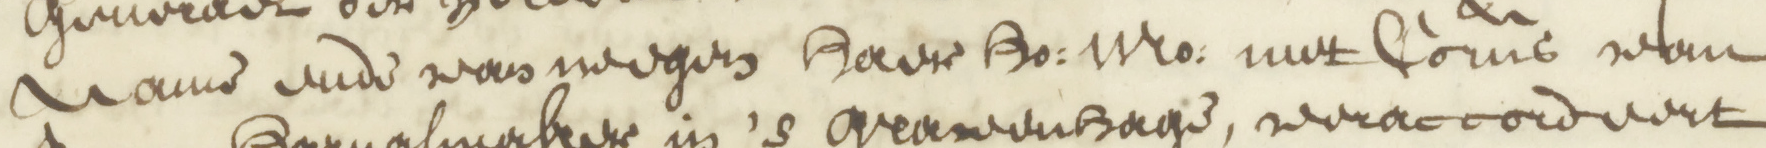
name ende van wegen Haer Ho:Mo: met Corns van
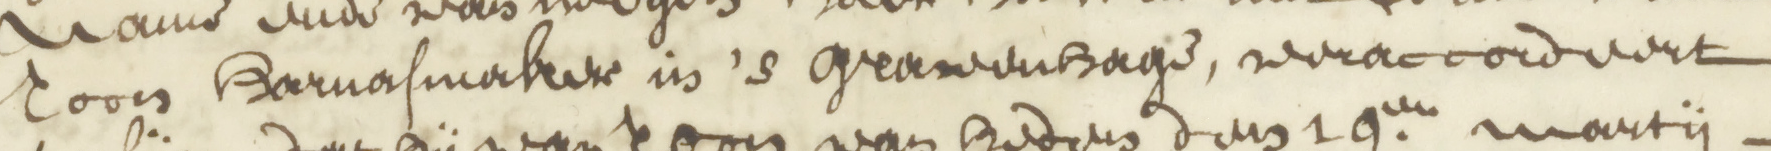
roon Harnasmaker in 's Gravenhage, veraccordeert
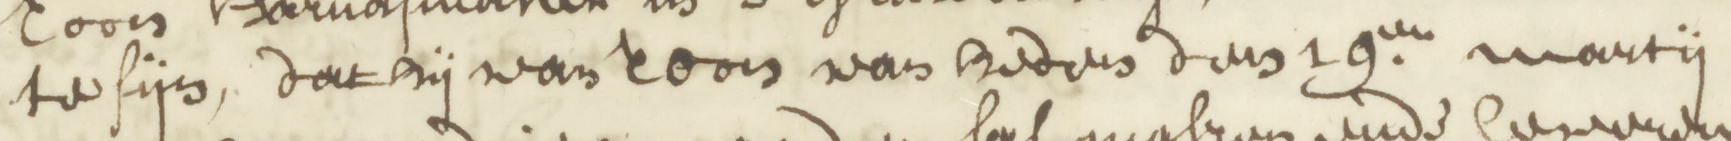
te sijn, dat hij van van roon van heden den 19en martij —
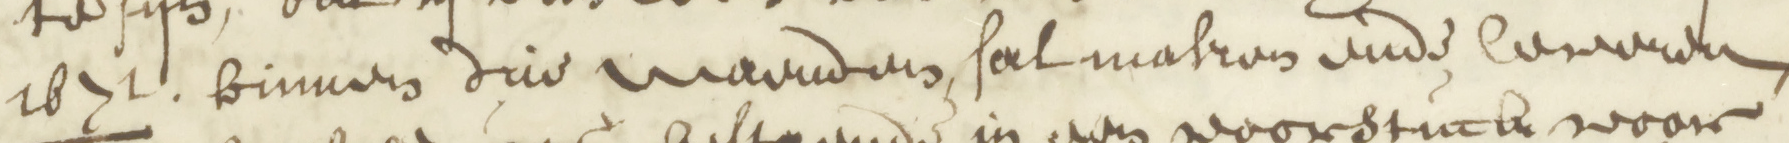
1671 binnen drie maenden sal maken ende leveren
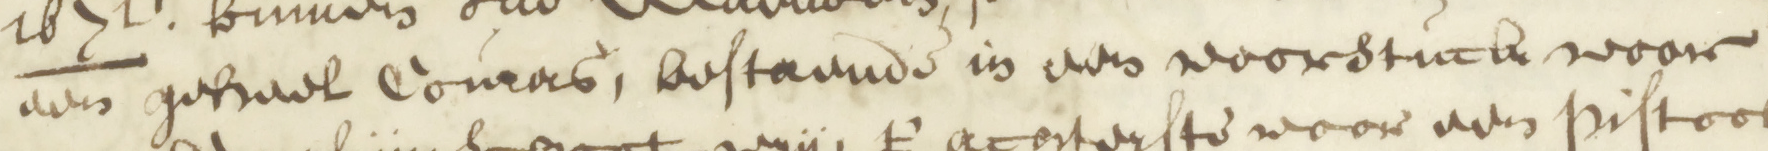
een geheel couras, bestaende in een voorstuck voor
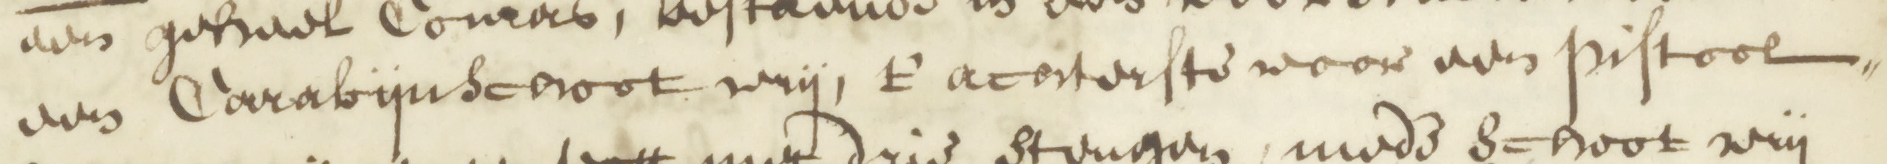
een Carabijnschoot vrij, t' achterste voor een Pistool
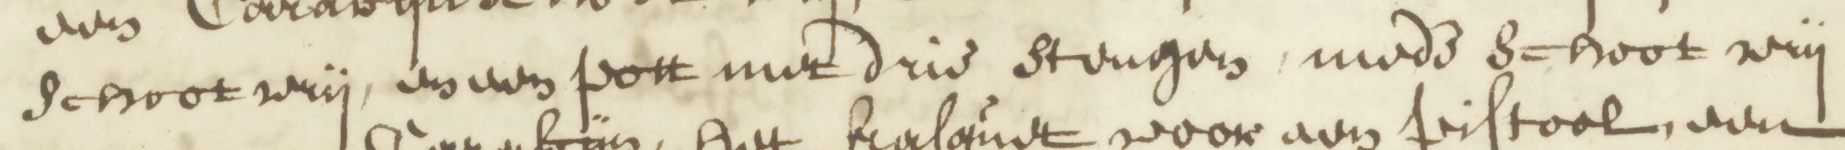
schoot vrij, eenen pott met drie stengen mede schoot vrij
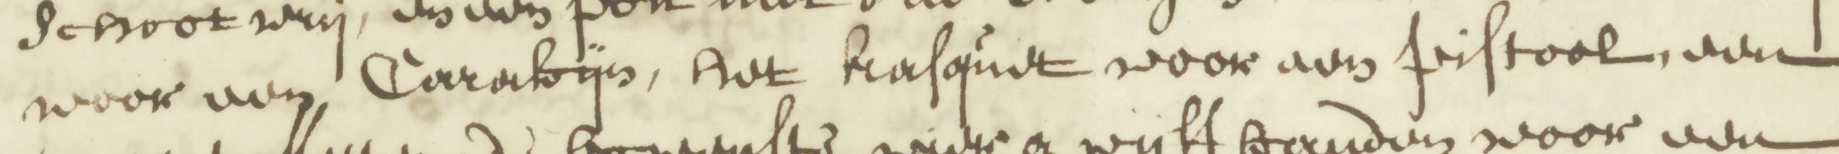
voor een Carabijn, het kasquet voor een pistool, een
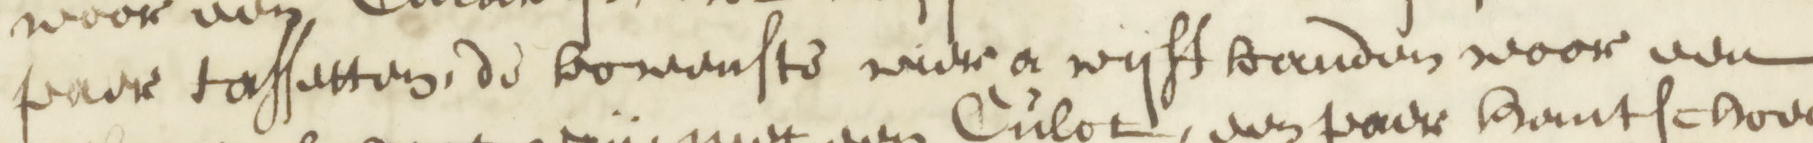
paer tassetten de bovenste vier a vijff banden voor een
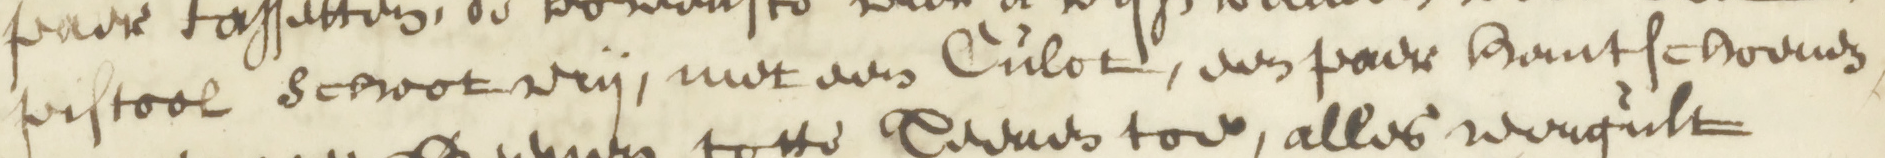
pistool schoot vrij, met een Culot, een paer hantschoenen
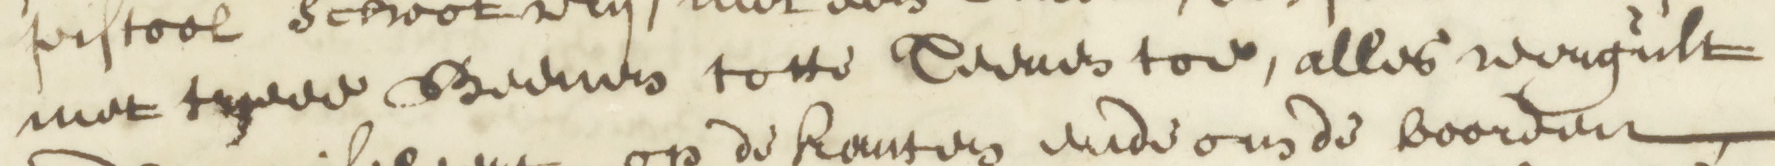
met twee Beenen totte Teenen toe, alles vergult
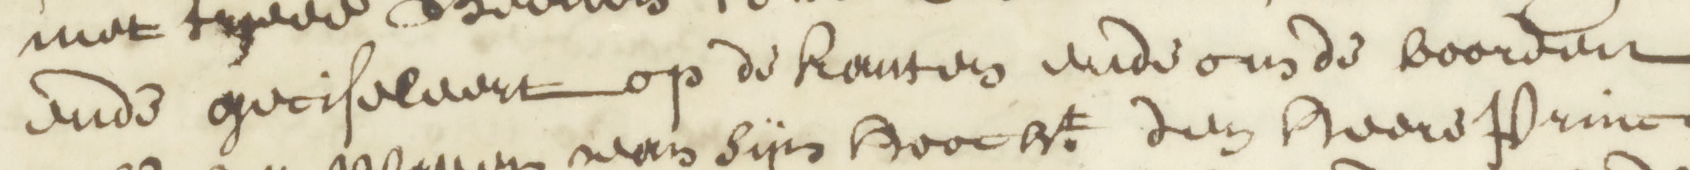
ende geciseleert op de kanten ende om de boorden
